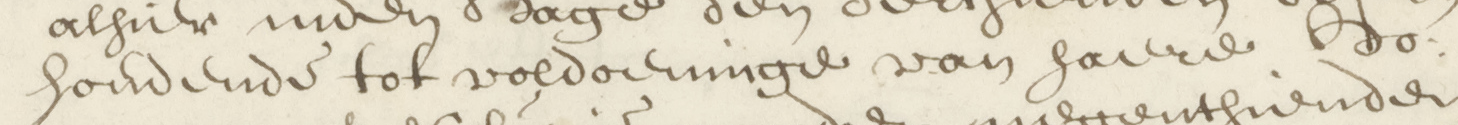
houdende tot voldoeninge van haere Ho:
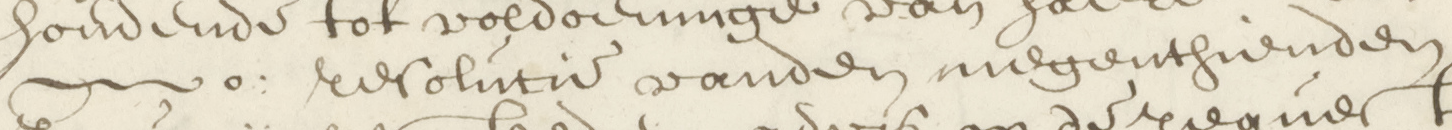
Mo: resolutie vanden negenthienden
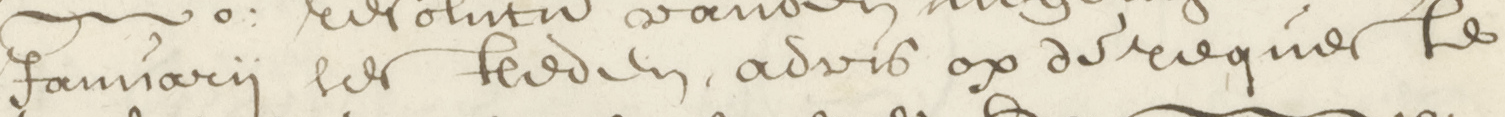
Januarij lestleden, advis op de requeste
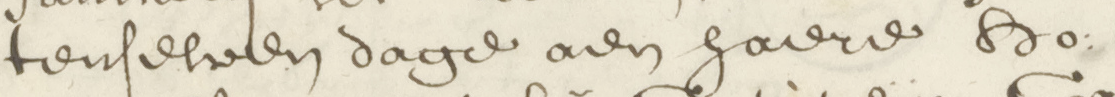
tenselven dage aen haere Ho:Mo:
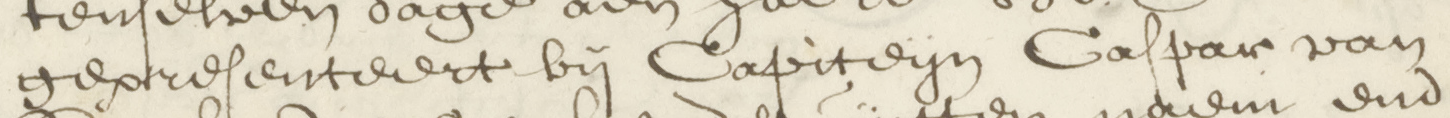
gepresenteert bij Capiteijn Caspar van
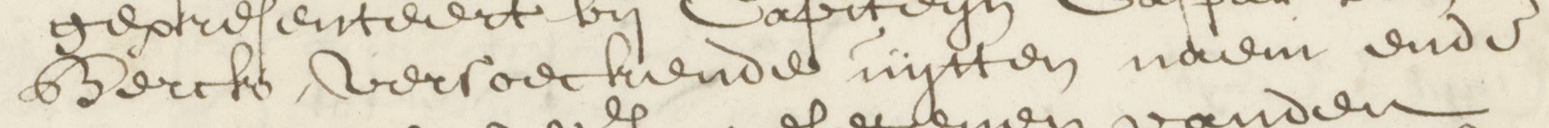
Berck, versoeckende uijtten naem ende
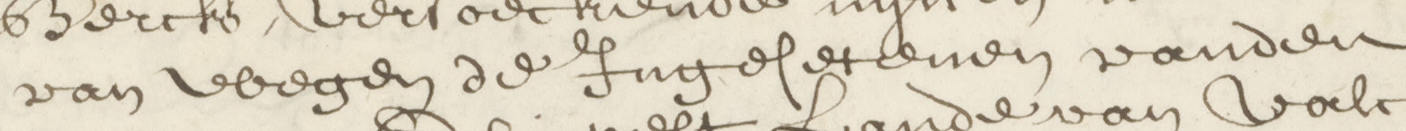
van wegen de Ingesetenen vanden
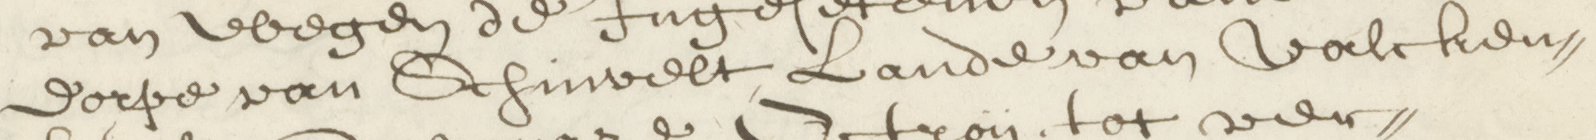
Dorpe van Schinvelt, Lande van Valcken„
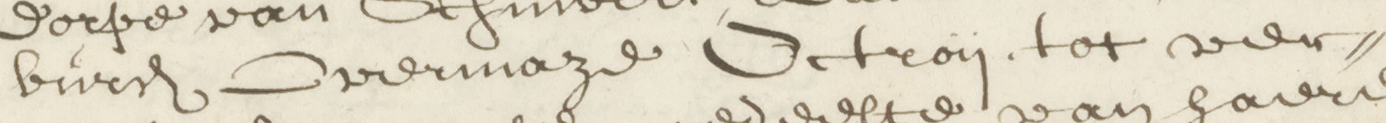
burch Overmaze Octroij tot ver„
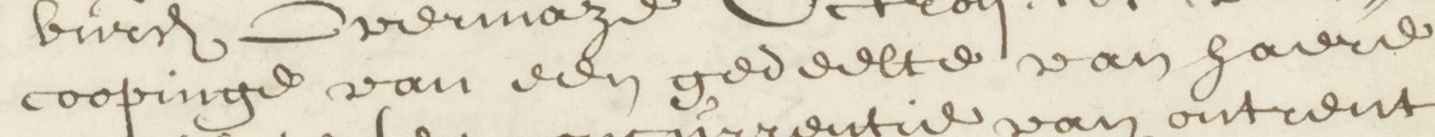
coopinge van een gedeelte van haere
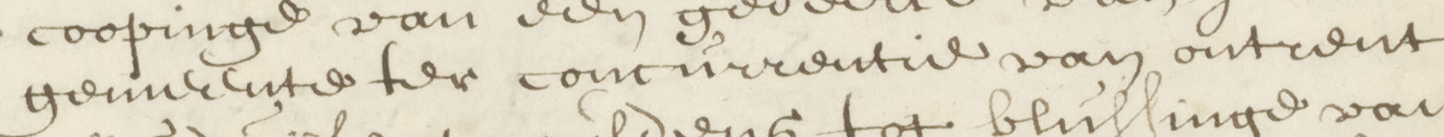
gemeente ter concurrentie van ontrent
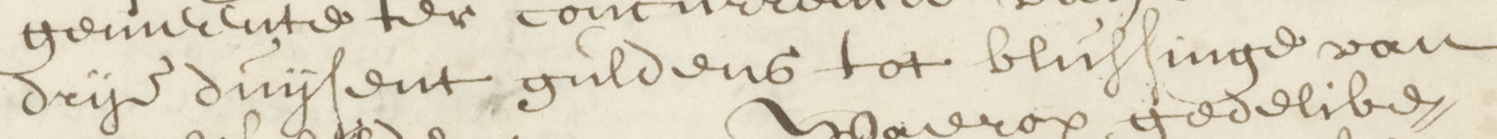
drije duijsent guldens tot blussinge van
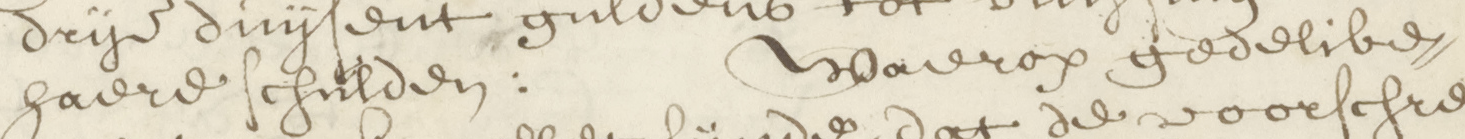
haere schulden: Waerop gedelibe„
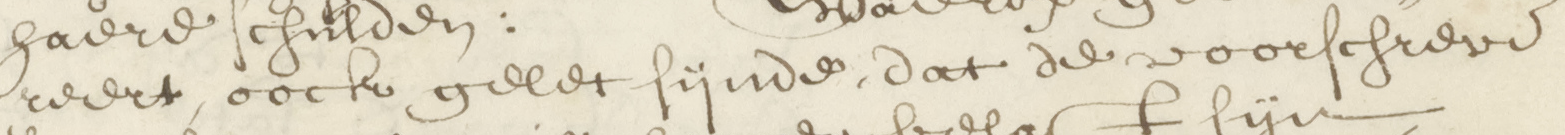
reert, oock gelet sijnde, dat de voorschreve
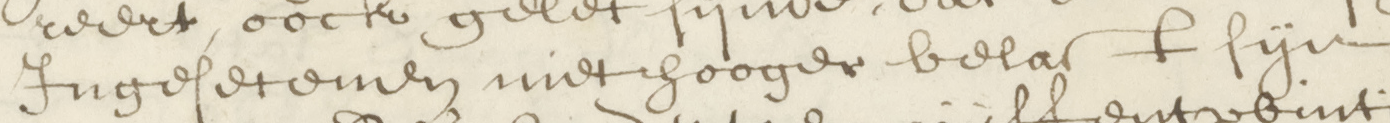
Ingesetenen niet hooger belast sijn,
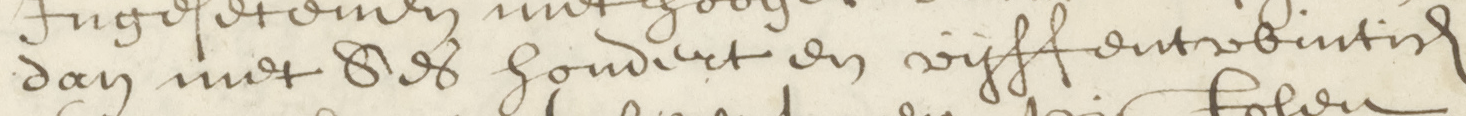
dan met Ses hondert en vijffentwintich
